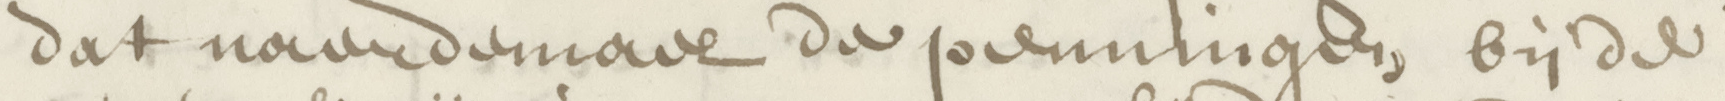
dat naerdemael de penningen bij de
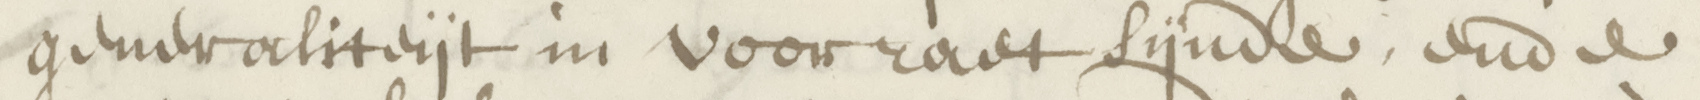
generaliteijt in voorraet sijnde, ende
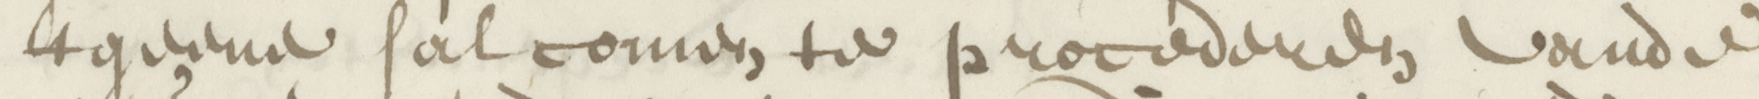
tgeene sal comen te procederen vande
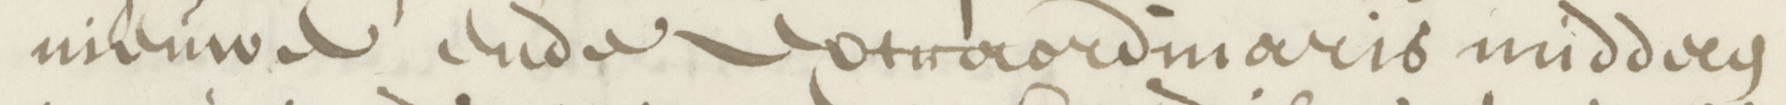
nieuwe ende Extraordinaris middelen
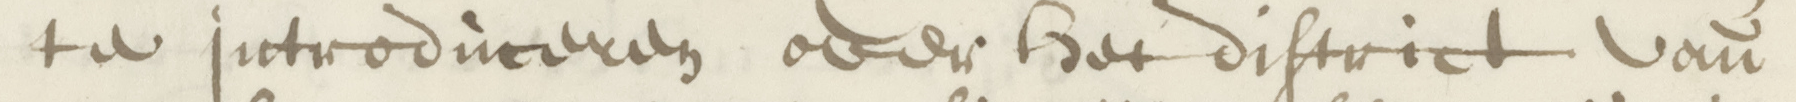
te introduceren over het district van
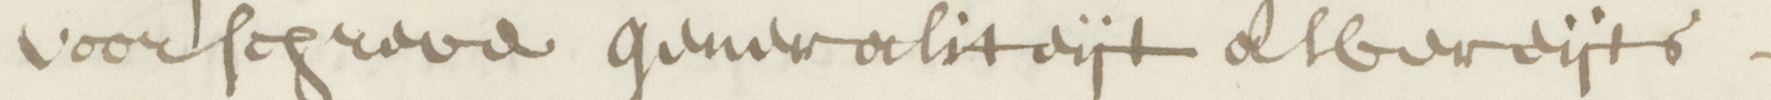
voorschreve generaliteijt albereijts
